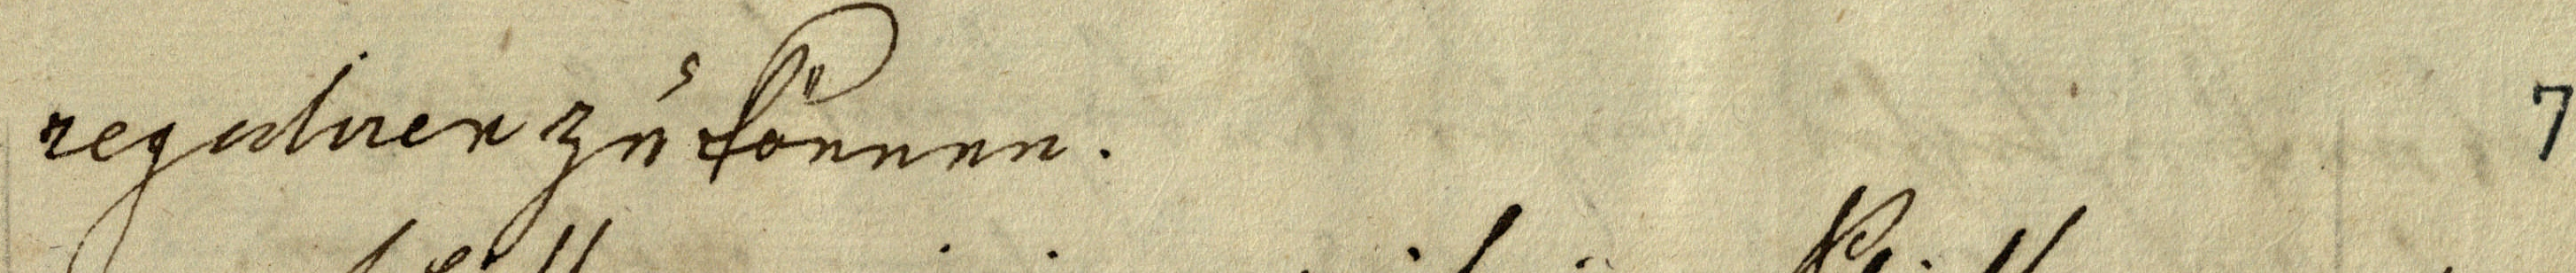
reguliren zu können.
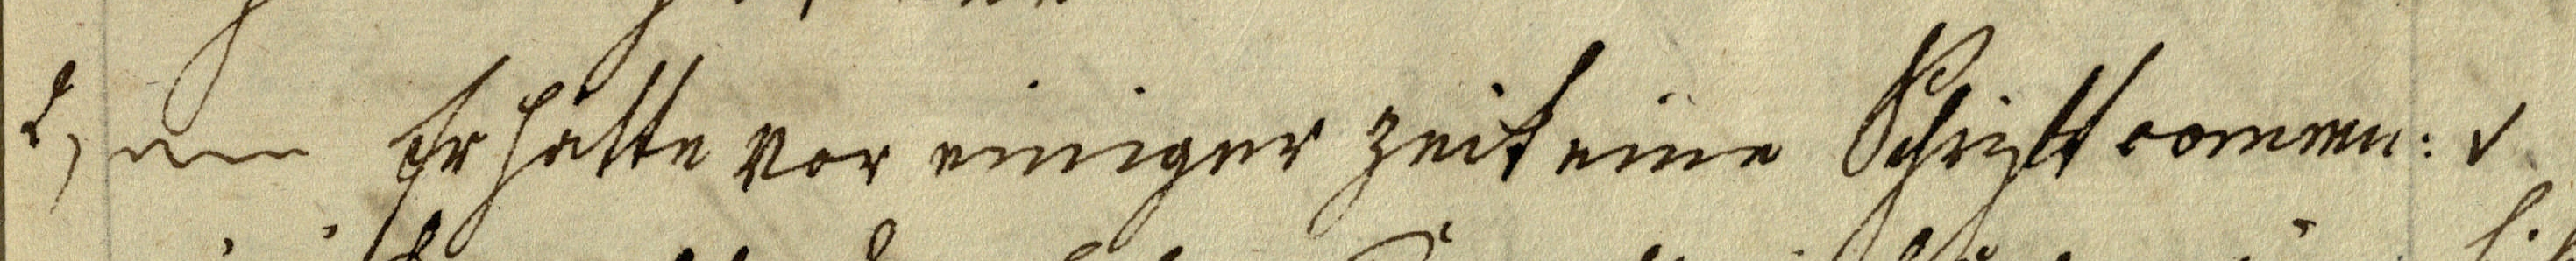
2, Er hätte voreiniger Zeit eine Schrift commu¬
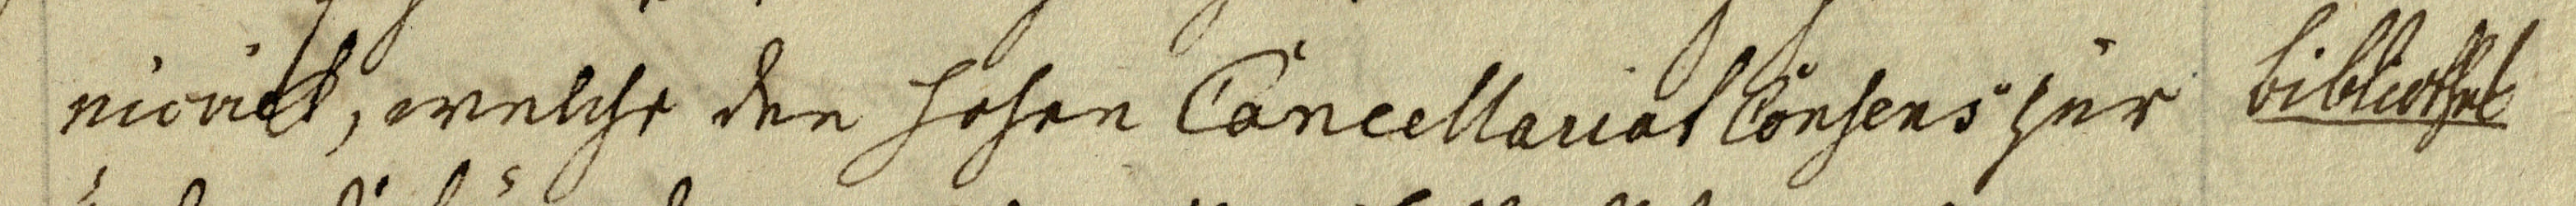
niciret, welche den hohen Cancellariat Consens zur Bibliothek
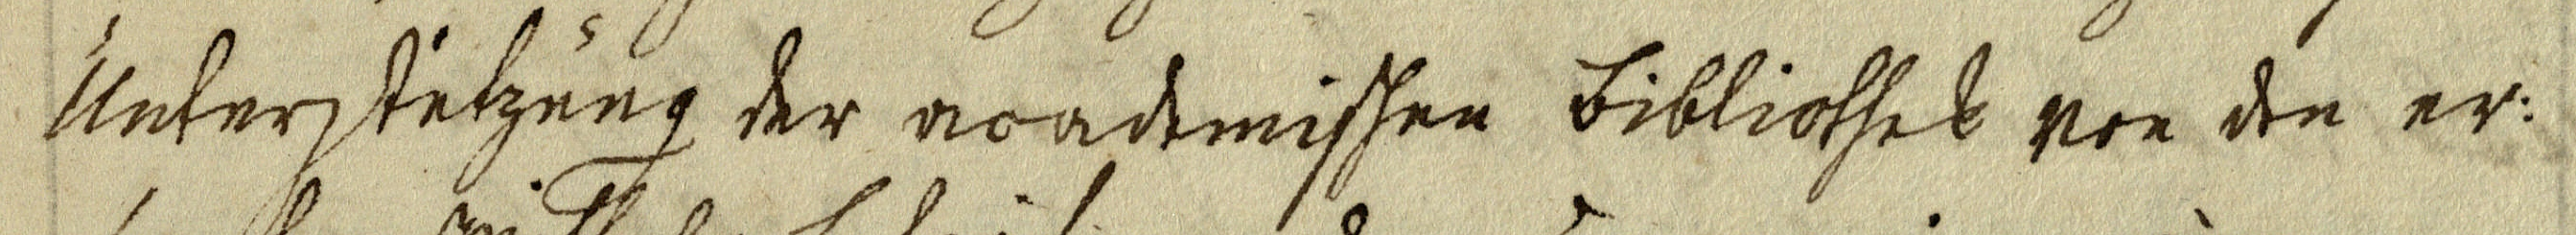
Unterstützung der academischen Bibliothek von den er¬
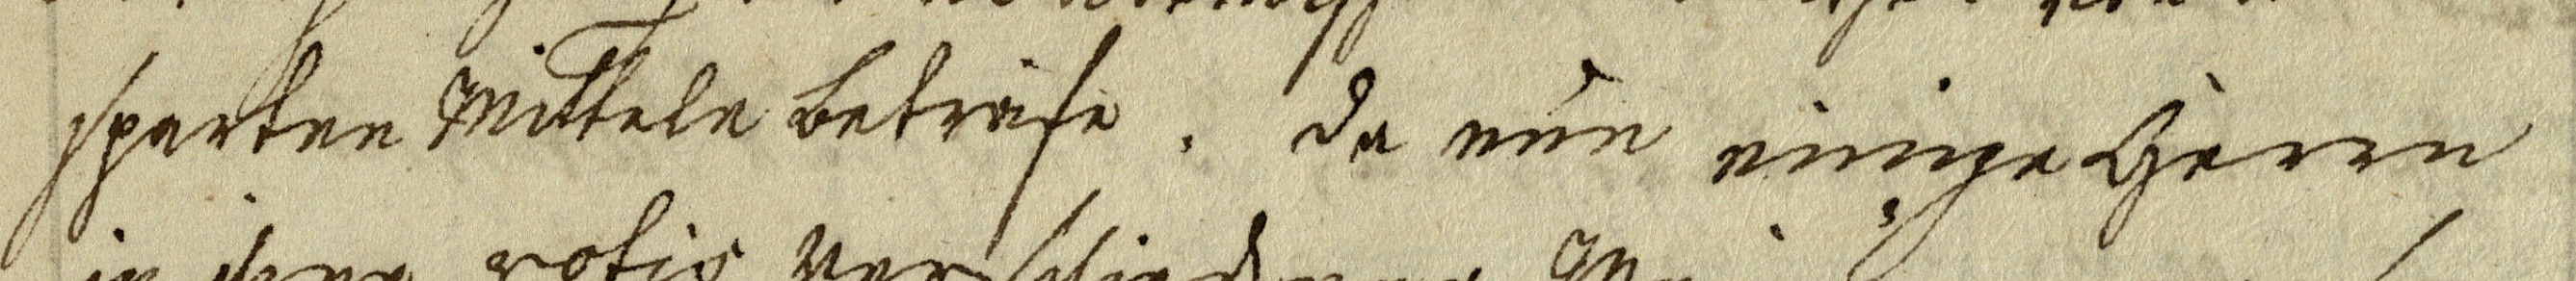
sparten Mitteln beträfe. Da nun einige Herrn
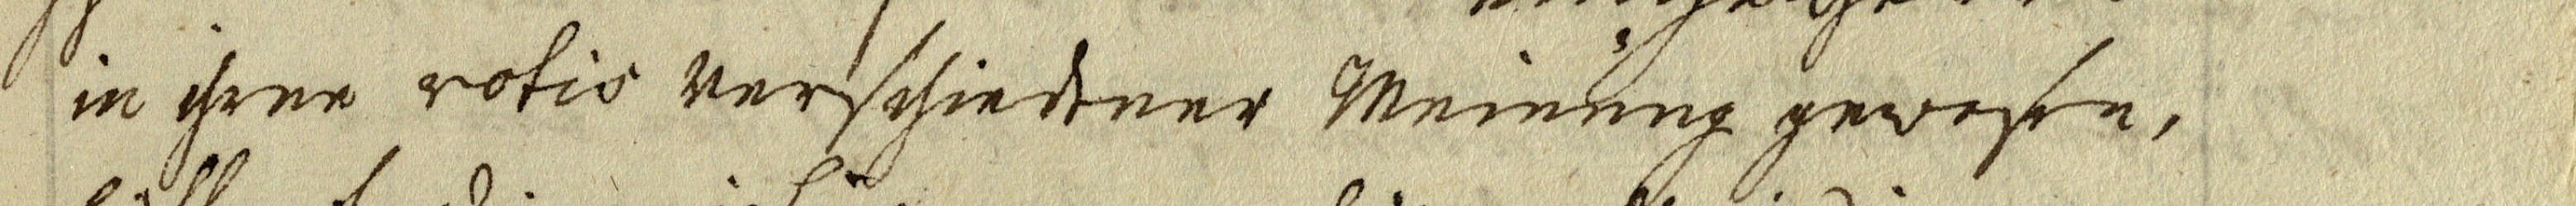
in ihren votis verschiedener Meinung gewesen,
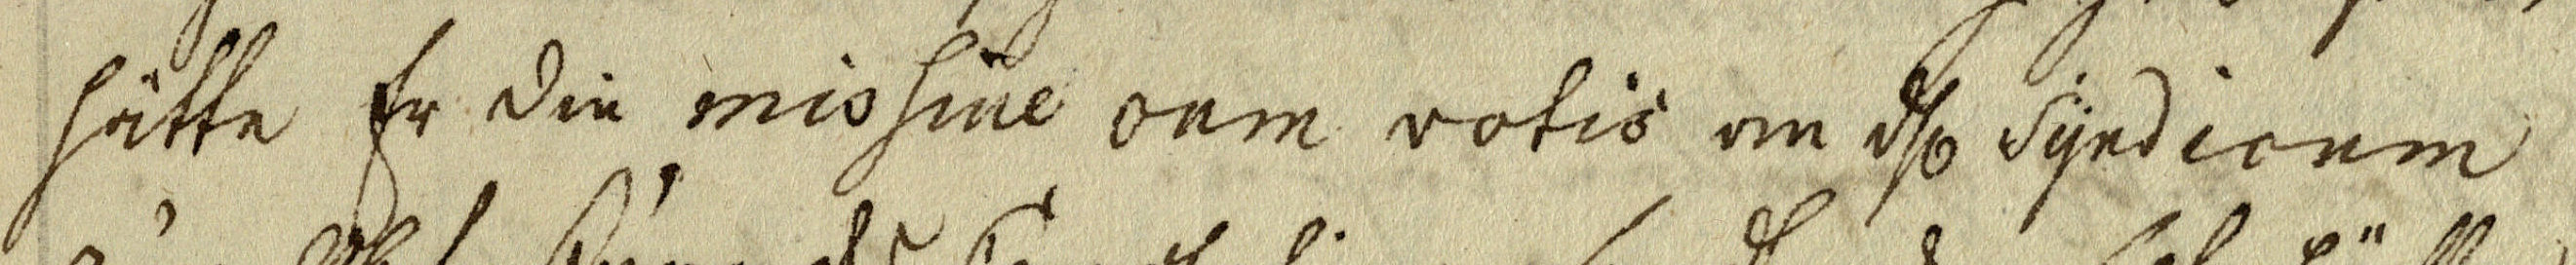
hätte Er die missine cum votis an dh Sÿndicum
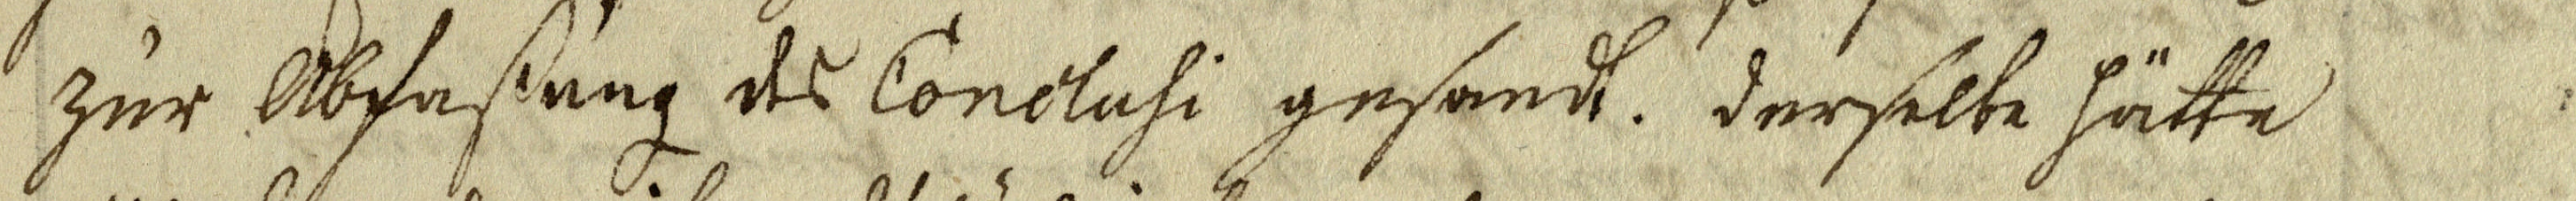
zur Abfaßung des Conclusi gesandt. Derselbe hätte
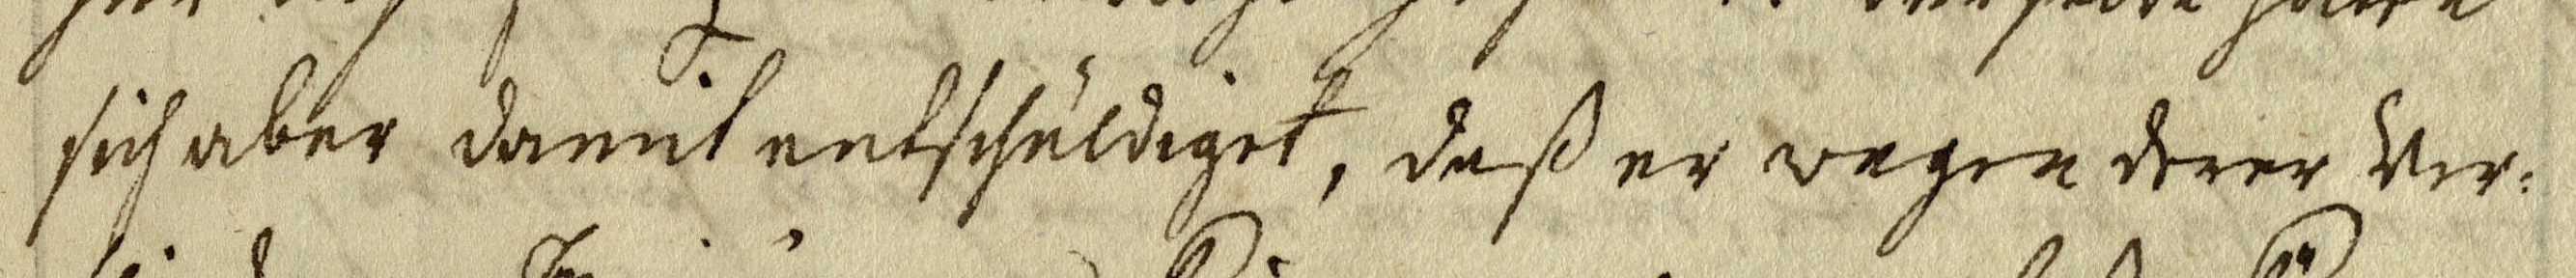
sich aber damit entschuldiget, daß er wegen derer ver¬
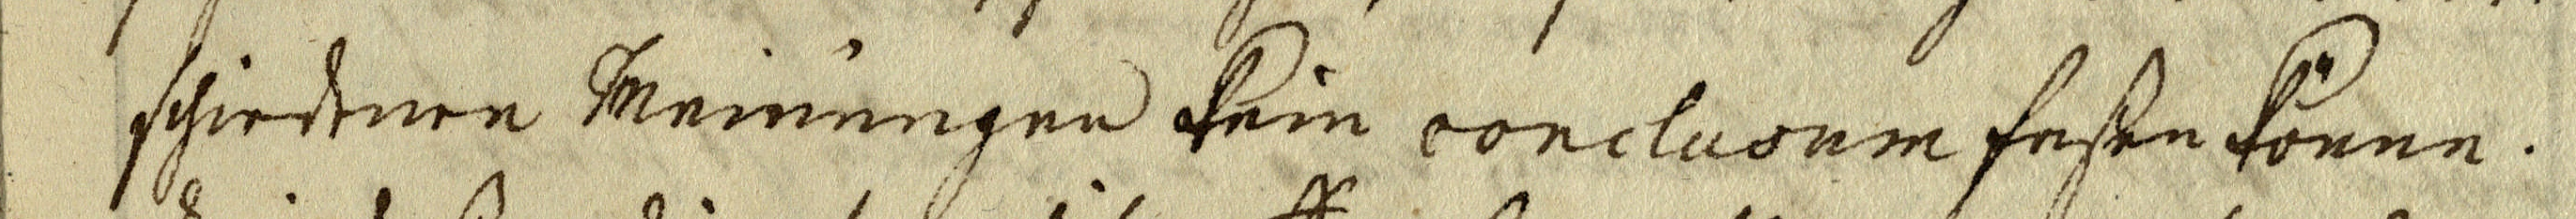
schiedenen Meinungen kein conclusum faßen könne.
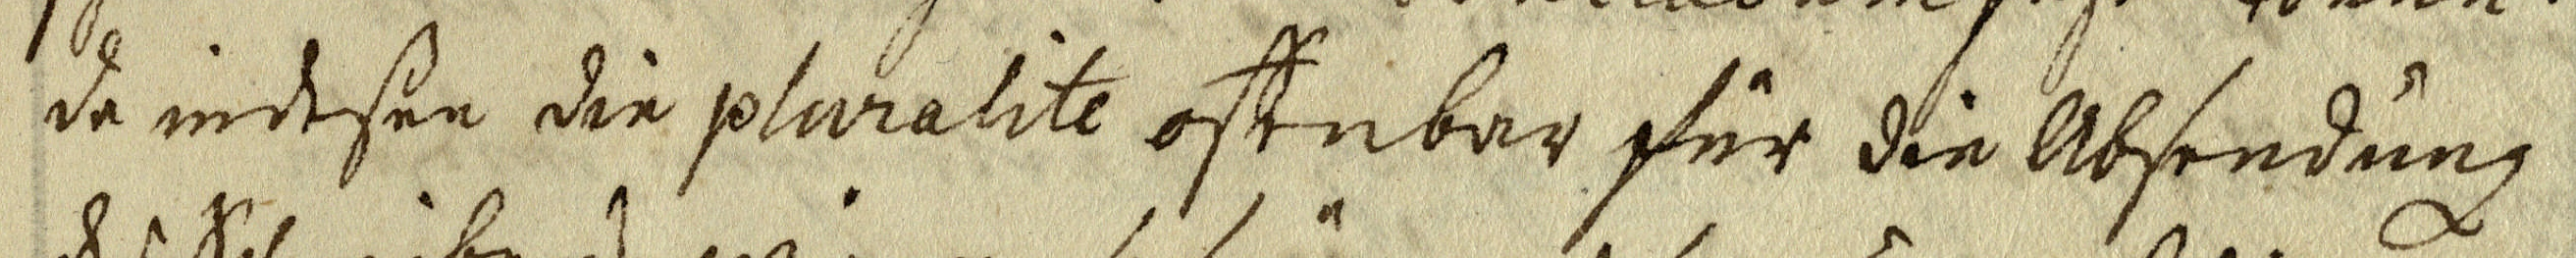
da indeßen die pluralite offenbar für die Absendung
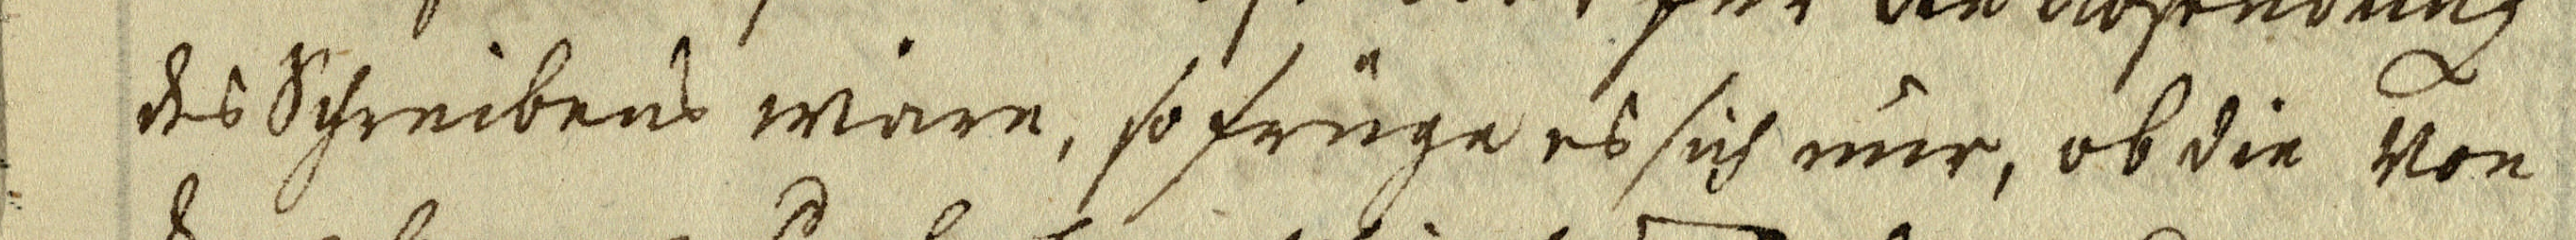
des Schreibens wäre, so früge es sich nur,ob die von
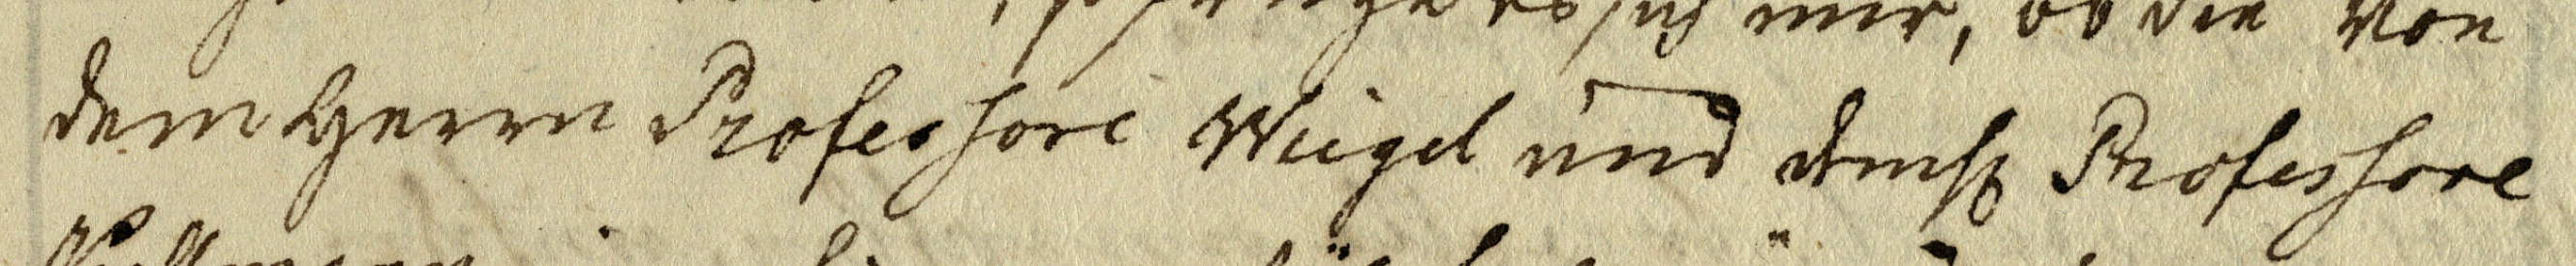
dem Herrn Professore Weigel und demh. Professore
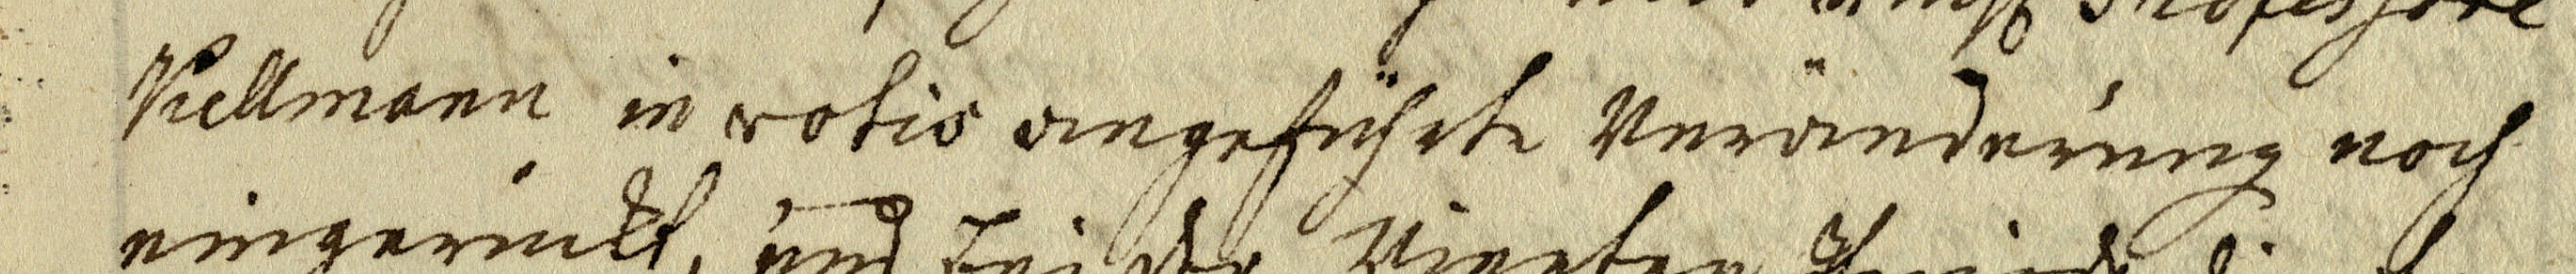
kellmann in votis angesuchte Veränderung noch
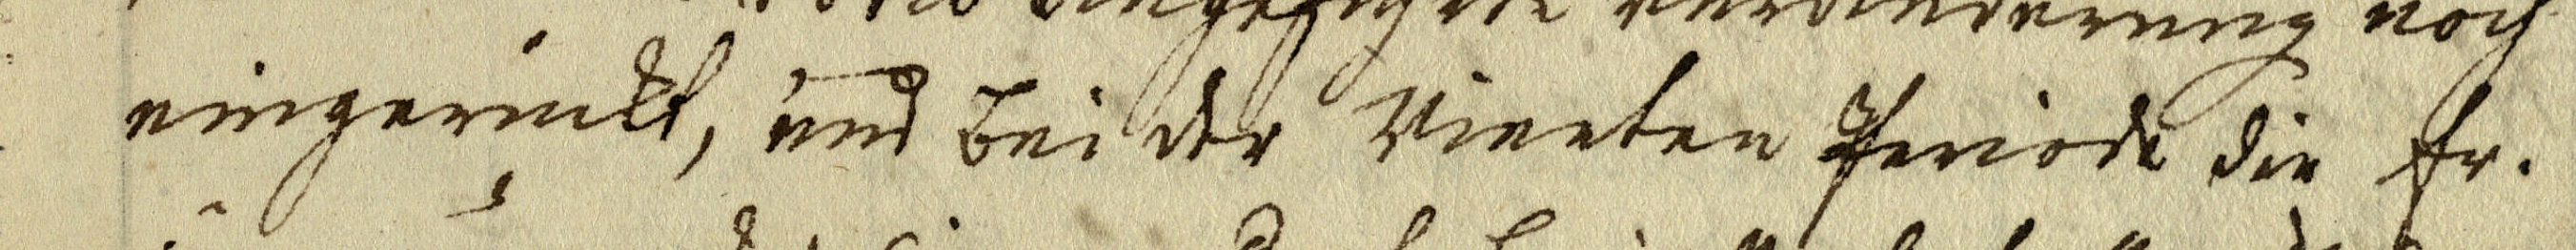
eingerückt, und bei der vierten Periode die Er¬
